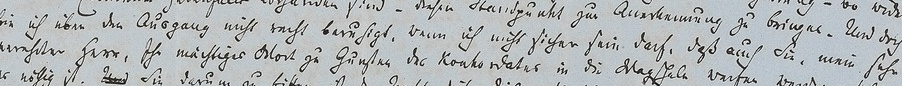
bin ich über den Ausgang nicht recht beruhigt, wenn ich nicht sicher sein darf, daß auch Sie, mein sehr
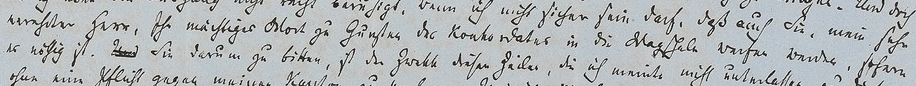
verehrter Herr, Ihr mächtiges Wort zu Gunsten des Konkordates in die Wagschale werfen werden, sofern
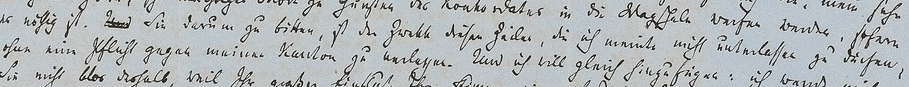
es nöthig ist. Sie darum zu bitten, ist der Zwekk dieser Zeilen, die ich meinte nicht unterlassen zu dürfen,
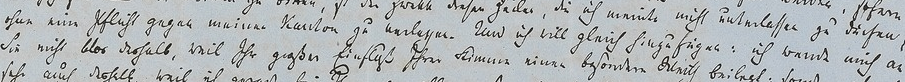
ohne eine Pflicht gegen meinen Kanton zu verletzen. Und ich will gleich hinzufügen: ich wende mich an
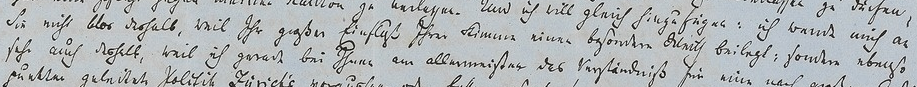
Sie nicht blos deshalb, weil Ihr großer Einfluß Ihrer Stimme einen besondren Werth beilegt, sondern ebenso
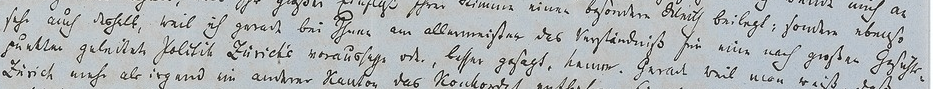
sehr auch deshalb, weil ich gerade bei Ihnen am allermeisten das Verständniß für eine nach großen Gesichts-
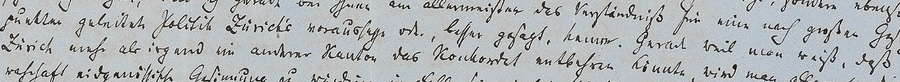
punkten geleitete Politik Zürich's voraussage oder, besser gesagt, kenne. Gerade weil man weiß, daß
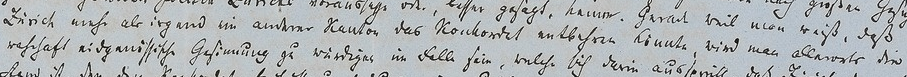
Zürich mehr als irgend ein andrer Kanton das Konkordat entbehren könnte, wird man allerorts die
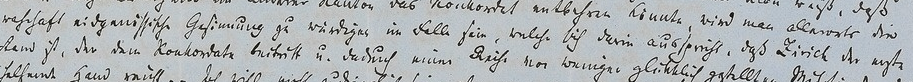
wahrhaft eidgenössische Gesinnung zu würdigen im Falle sein, welche sich darin ausspricht, daß Zürich der erste
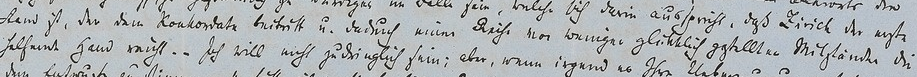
Stand ist, der dem Konkordate beitritt u. dadurch einer Reihe von weniger glükklich gestellen Mißständen die
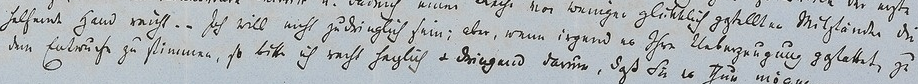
helfende Hand reicht. – Ich will nicht zudringlich sein; aber, wenn irgend es Ihre Ueberzeugung gestattet, zu
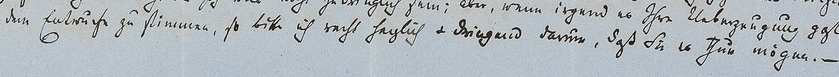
dem Entwurfe zu stimmen, so bitte ich recht herzlich & dringend darum, daß sie es thun mögen. –
